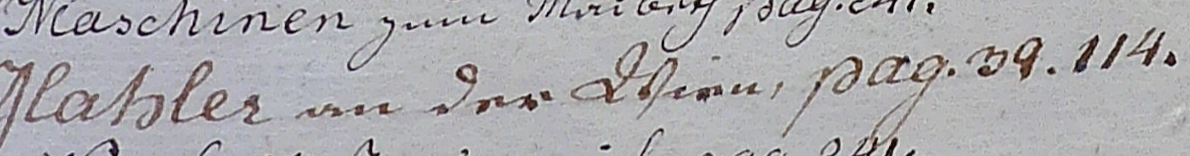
Mahler an der Wien, pag. 39. 114.
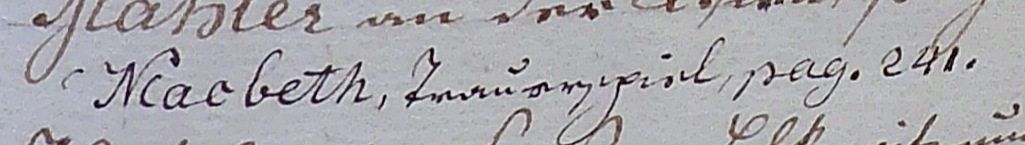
Macbeth, Trauerspiel, pag. 241.
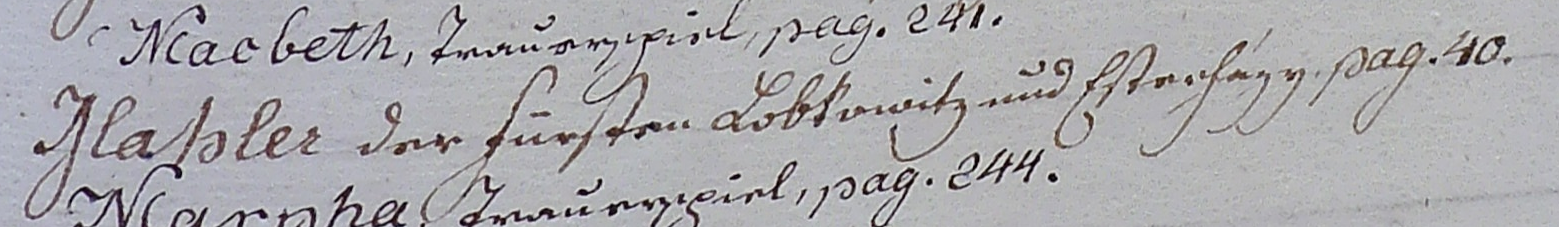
Mahler der Fürsten Lobkowitz und Esterházy. pag. 40.
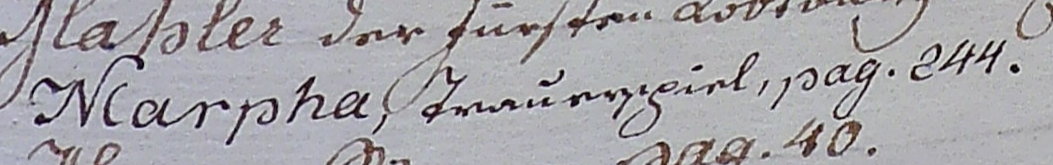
Marpha, Trauerspiel, pag. 244.
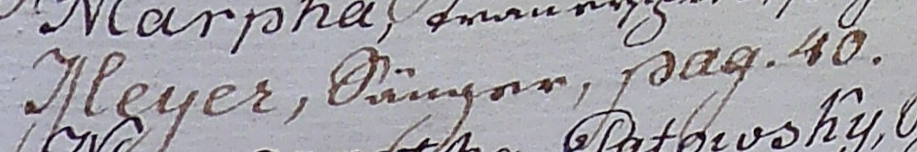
Meyer, Sänger, pag. 40.
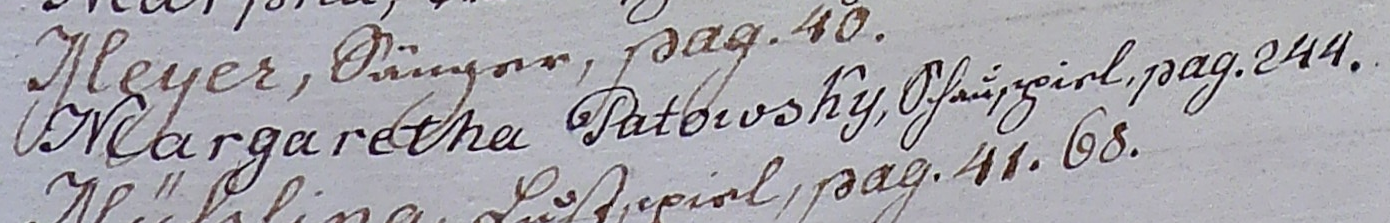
Margaretha Patowsky, Schauspiel. pag. 244.
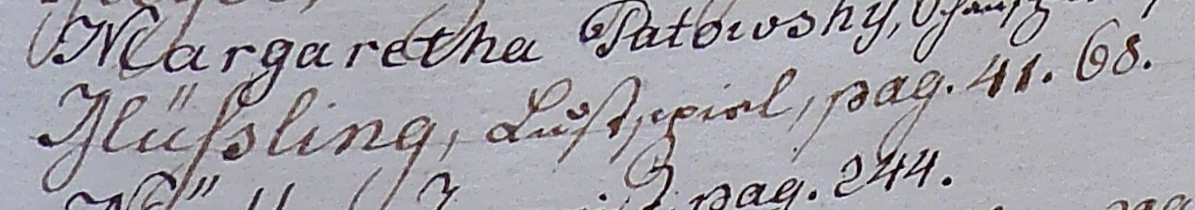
Müssling, Lustspiel, pag. 41. 68.
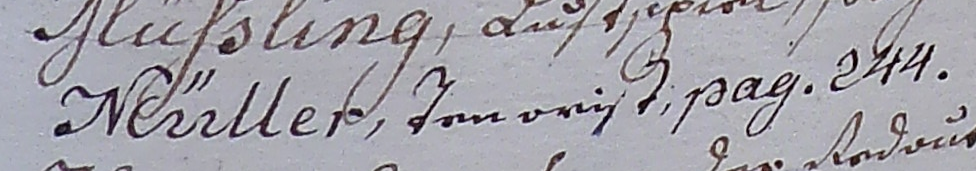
Müller, Tenorist, pag. 244.
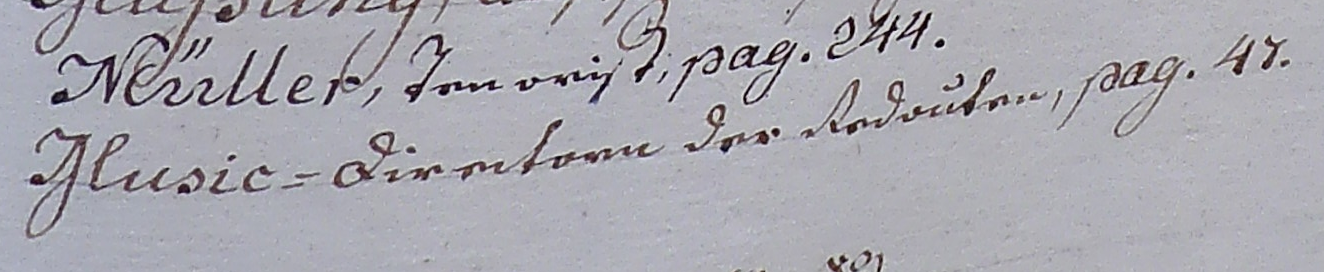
Music=Directorn der Redouten, pag. 47.
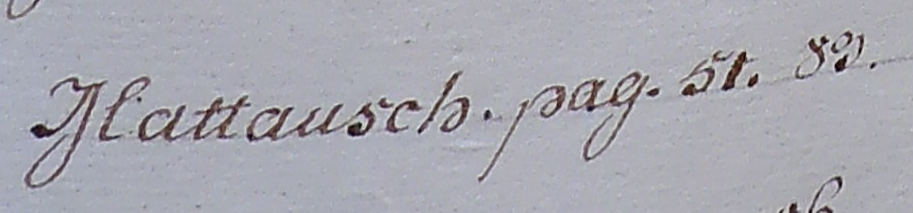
Mattausch. pag. 51. 83.
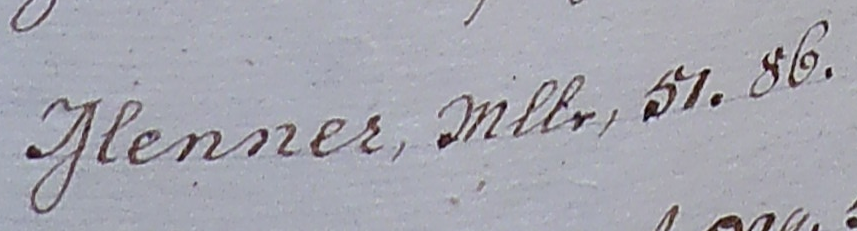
Menner, Mlle, 51. 86.
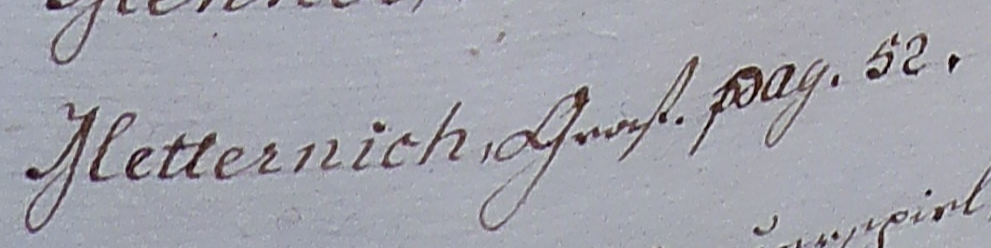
Metternich, Graf. pag. 52.
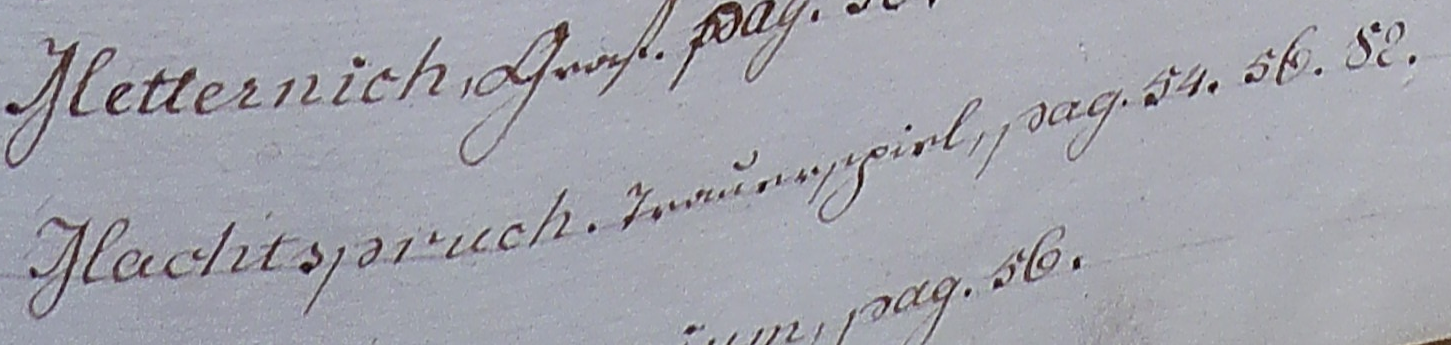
Machtspruch. Trauerspiel, pag. 54. 56. 82.
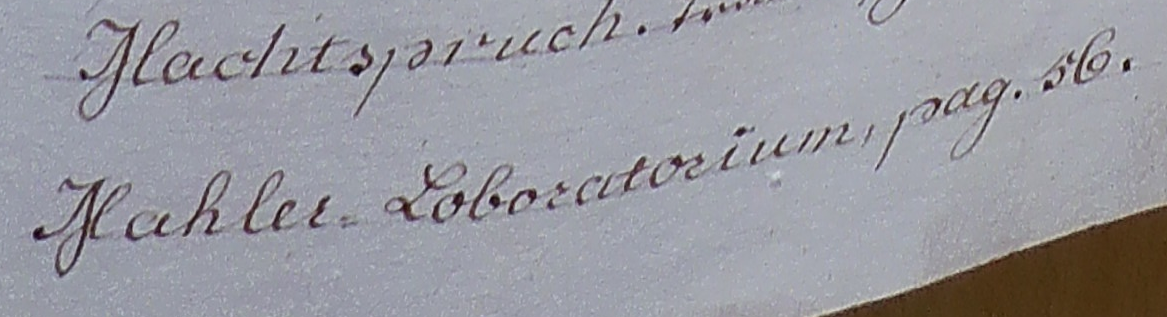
Mahler=Loboratorium, pag. 56.
